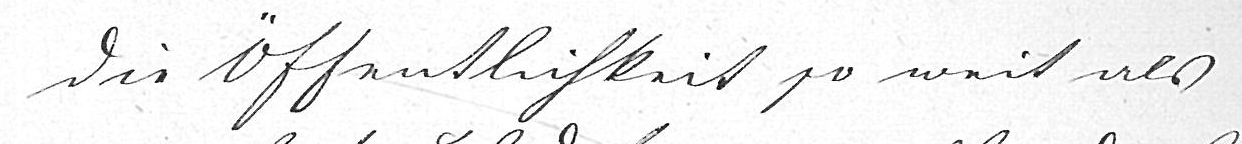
die Öffentlichkeit so weit als
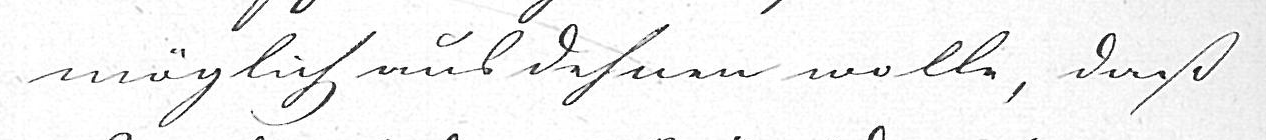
möglich ausdehnen wolle, daß
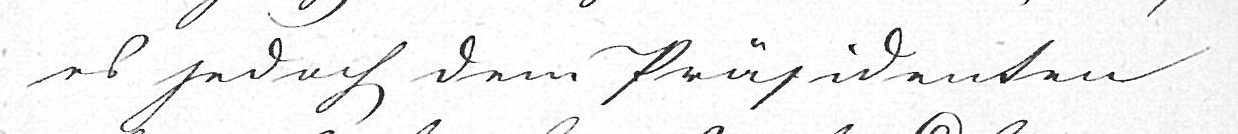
es jedoch dem Präsidenten
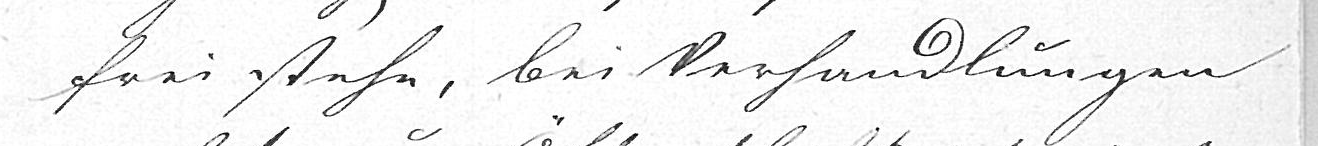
frei stehe, bei Verhandlungen
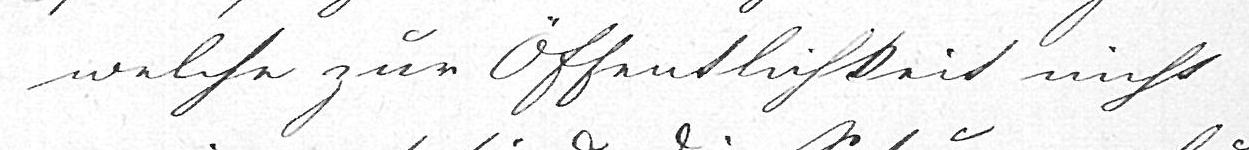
welche zur Öffentlichkeit nicht
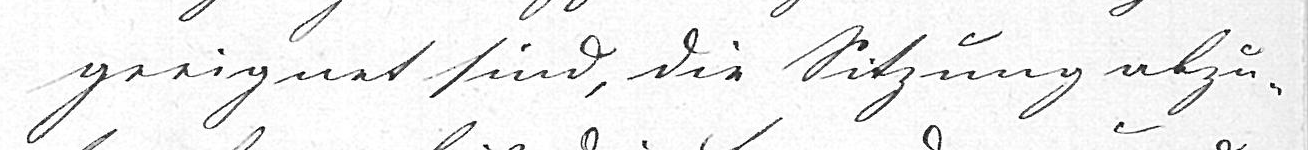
geeignet sind die Sitzung abzu-
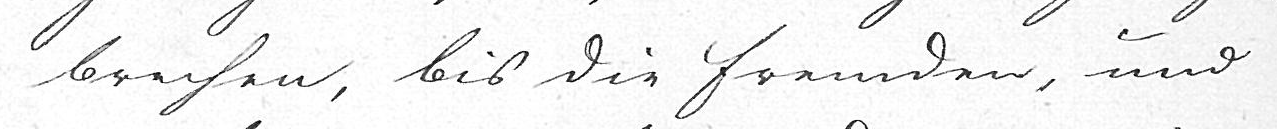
brechen, bis die Fremden, und
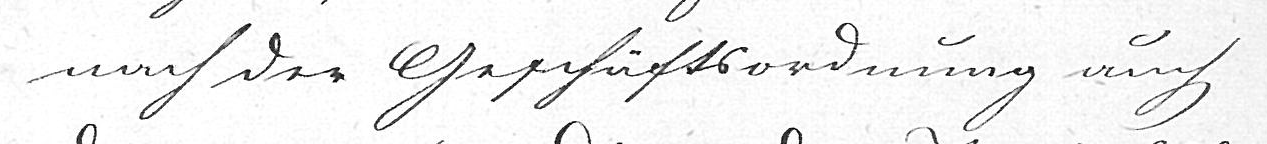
nach der Geschäftsordnung auch
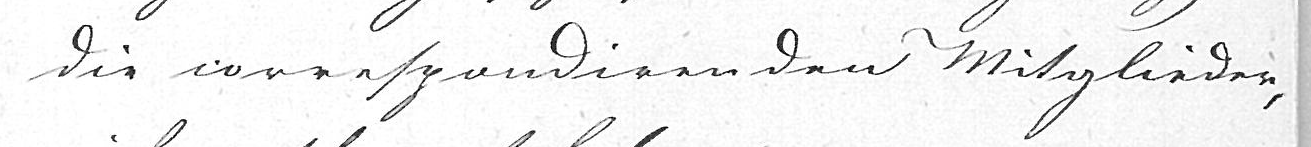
die correspondirenden Mitglieder
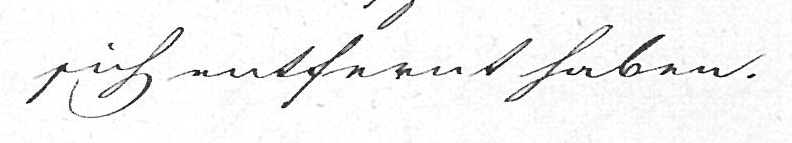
sich entfernt haben.
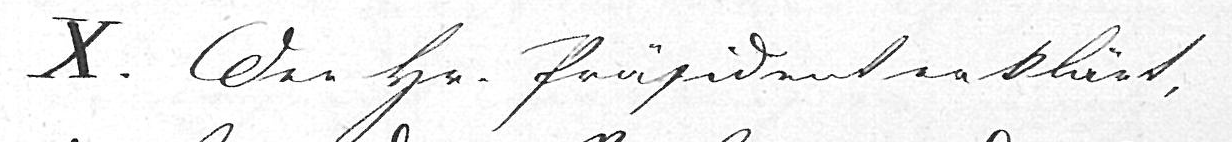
X. Der Hr. Präsident erklärt,
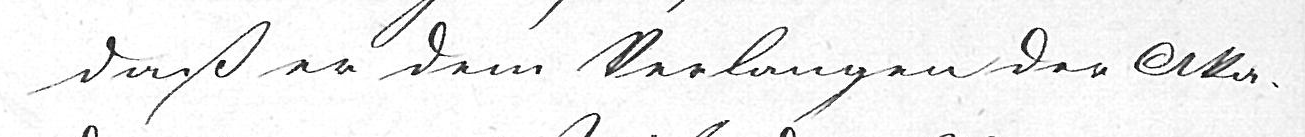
daß er dem Verlangen der Aka-
